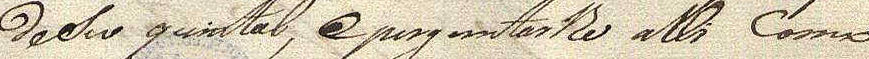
de Seo quintal, e perguntarlhe alli Como
